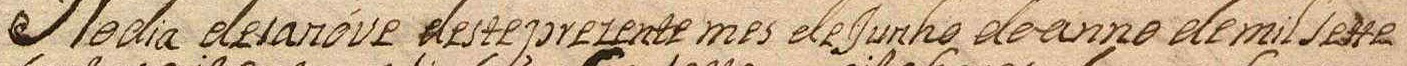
No dia desanóve deste prezente mes de Junho do anno de mil sette
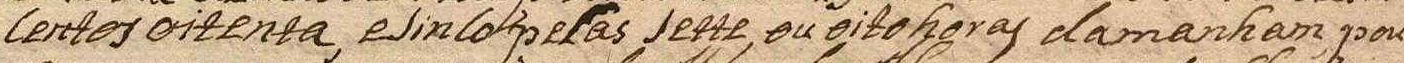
centos oitenta, e sinco pelas sette, ou oito horas da manham, pou
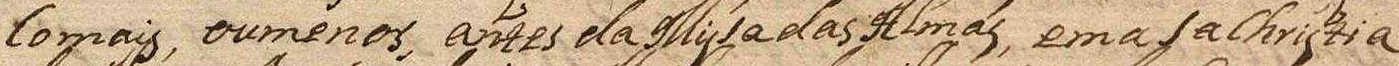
Co mais, ou menos, antes da Missa das ALmas, em a saChristia
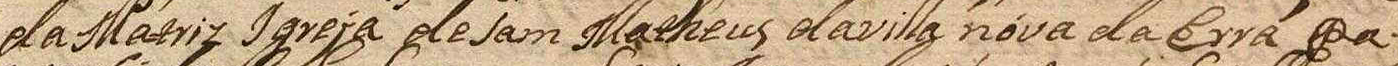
da Matriz Igreja de Sam Matheus da villa nóva da Erra Pa
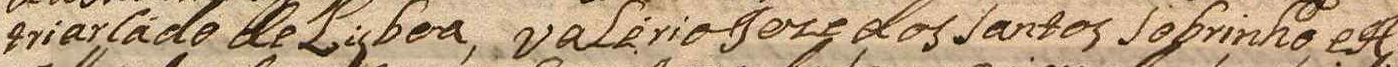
triarCado de Lisboa, vaLério Joze dos santos sobrinho, e A
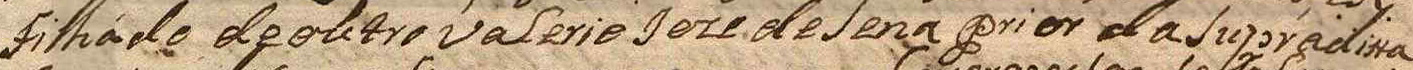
filhádo de outro vaLerio Ioze de sena prior da supraditta
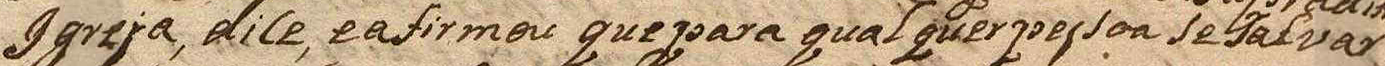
Jgreja, diCe, e afirmou que para quaLquer pessoa se saLvar
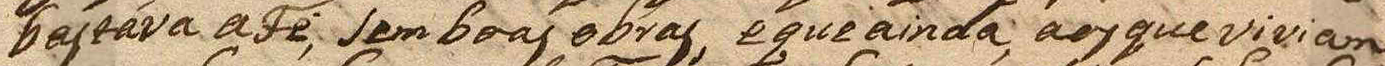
bastáva a Fé, sem boas obras, e que ainda, aos que viviam
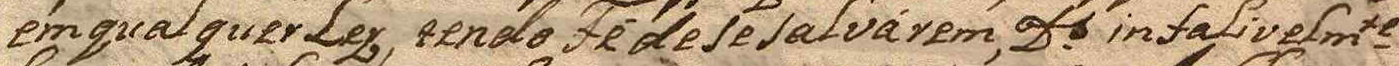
em quaLquer Ley, tendo Fé de se saLvárem, D.s infaLiveLm.te
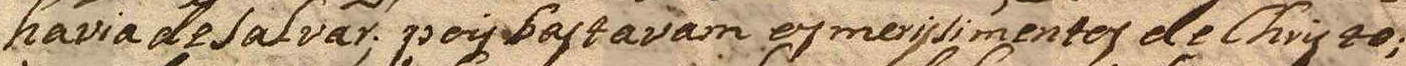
havia de saLvar, pois bastavam os merissimentos de Christo;
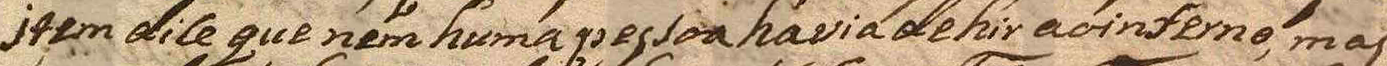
jtem diCe que nemhuma pessoa havia de hir ao inferno, mas
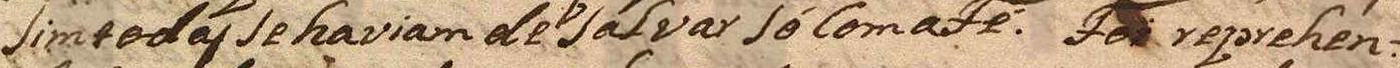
sim todas se haviam de salvar só Com a Fé. Foi reprehen
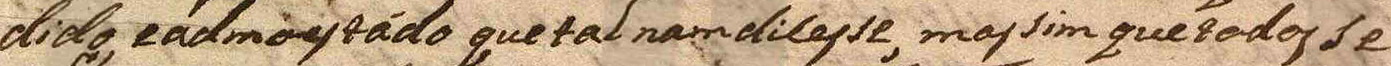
dido, e admoestádo que taL nam dicesse, mas sim que todos se
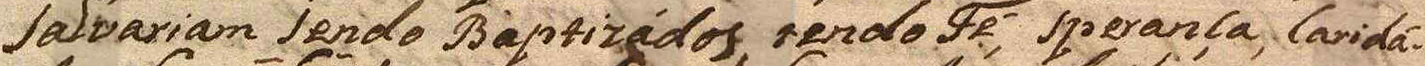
saLvariam sendo Baptizados, tendo Fé, speranÇa, Caridá
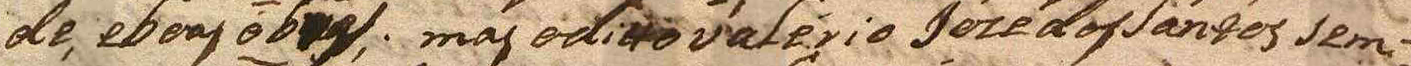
de, e boas ob_as; mas o ditto vaLério Joze dos santos sem
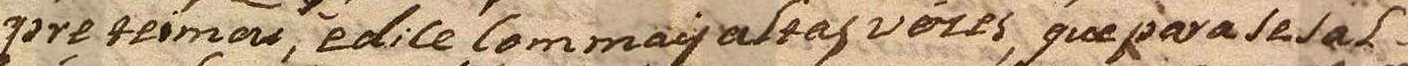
pre teimou, e diCe Com mais aLtas vózes, que para se saL
